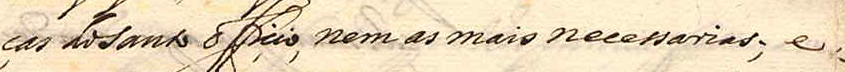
ças do santo offiçio, nem as mais necessarias; e
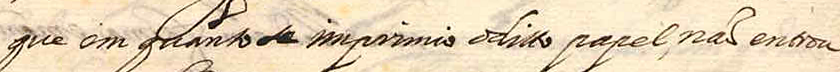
que em quanto se imprimio o ditto papel naõ entrou
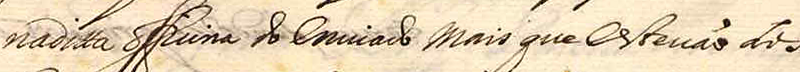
na ditta officina do Enuiado mais que Esteuaõ dos
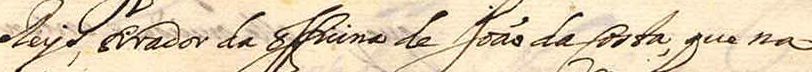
Reys, tirador da officina de Joaõ da Costa, que na
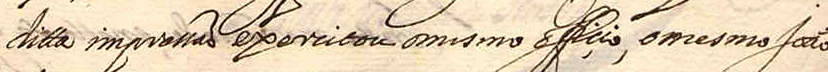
ditta impressão exercitou o mesmo offiçio, o mesmo João
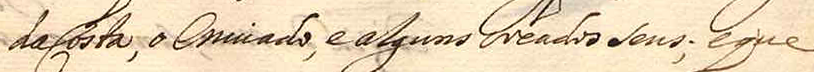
da Costa, o Enuiado, e alguns creados seus; e que
